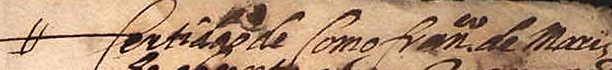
Certidaõ de Como fran.co de Maris
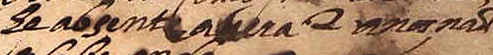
he absente avera 2 anos, naõ
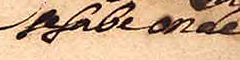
se sabe onde
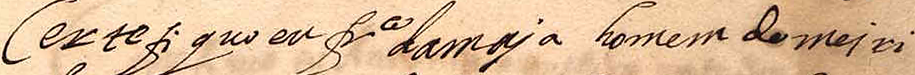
Certefiquo eu frco da maja homem do mejri
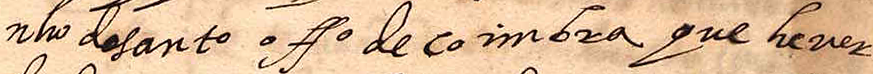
nho do santo offo de coimbra que he uer
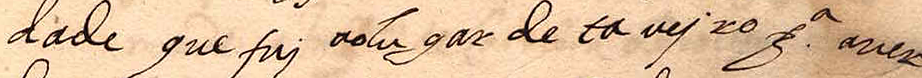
dade que fuj ao lugar de tauejro p.a auer
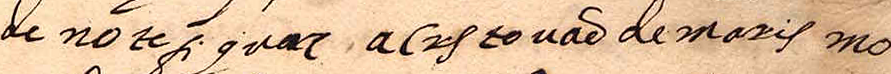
de notefiquar a Crstouão de maris mo
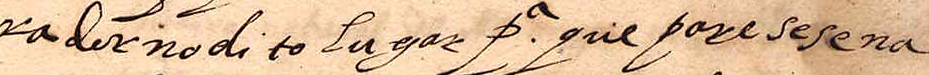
rador no dito lugar p.a que paresese na
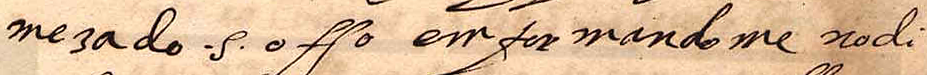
meza do .S. offo emformandome no di
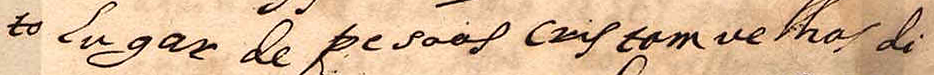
to lugar de pesoas cristam uelhas di
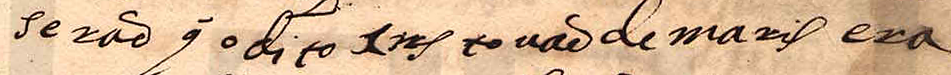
serão q̄ o dito crestouão de maris era
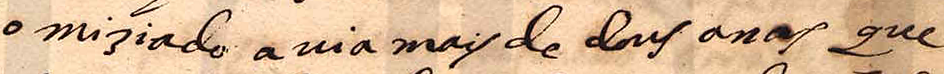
omiziado auia mais de dous anos que
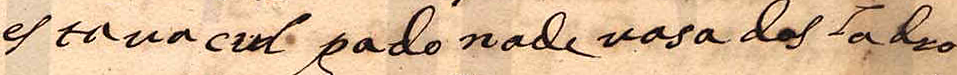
estaua culpado na deuasa dos ladro
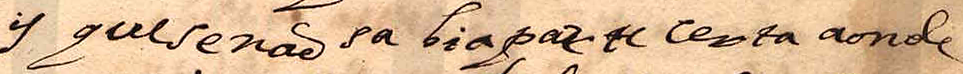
is que se não sabia parte certa aonde
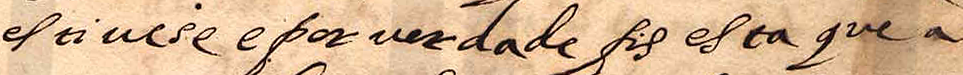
estiuese e por uerdade fis esta que a
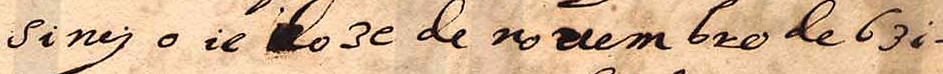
sinej oie doze de nouembro de 631
